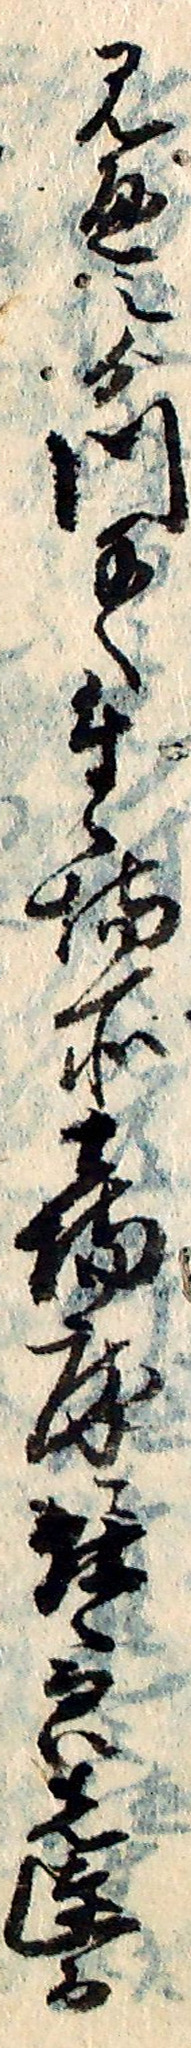見通しゟ川手へ付候場所土場床に仕候ては先達て
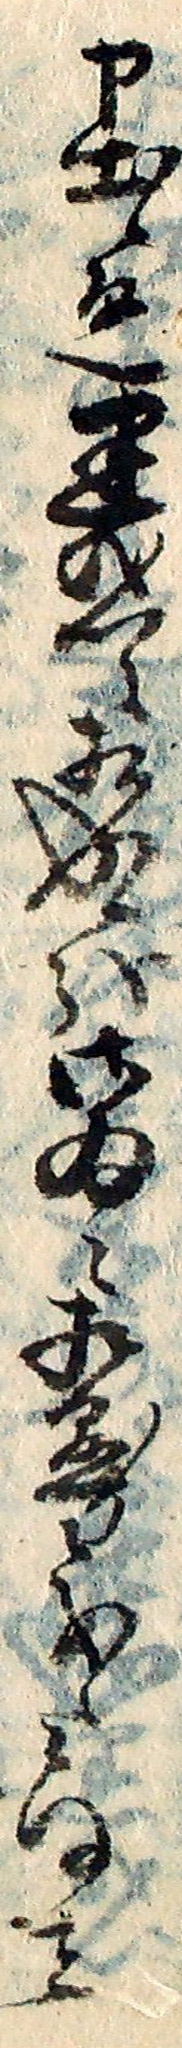申出候通迷惑に相成候哉御為に相懸り候義に候得は
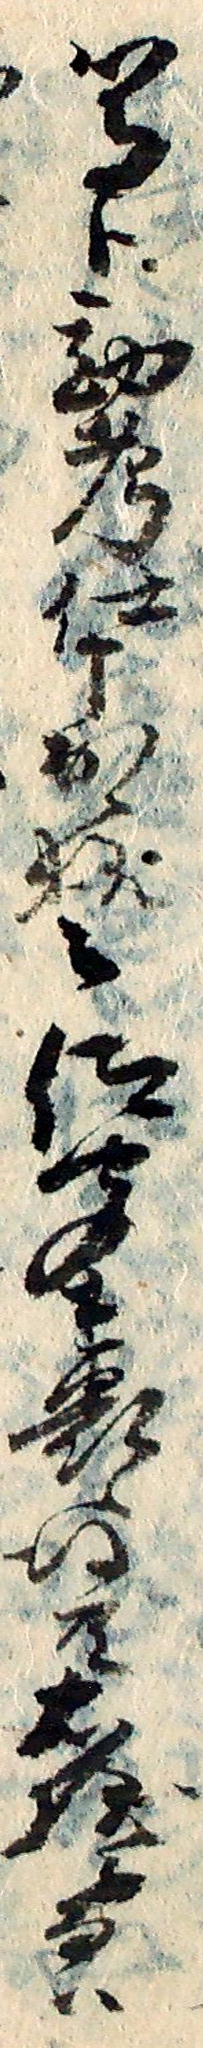篤と勘考仕申出候様被仰聞奉畏候得共右様にては
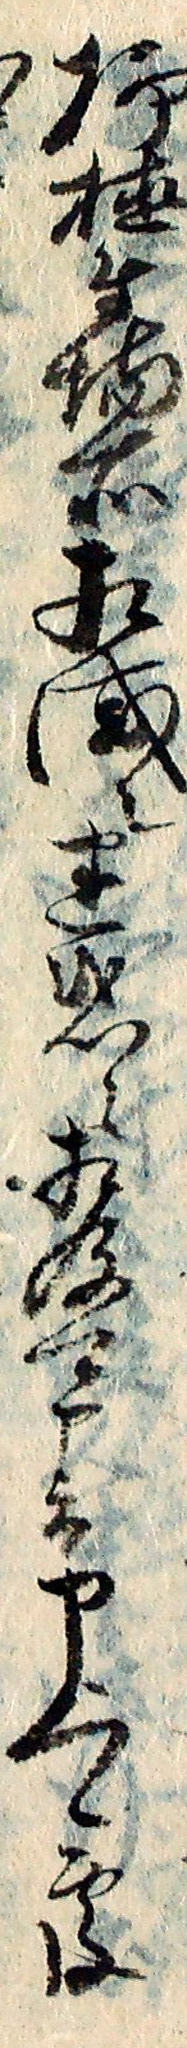柳植付場所相減し迷惑に相及可申旨申上候処
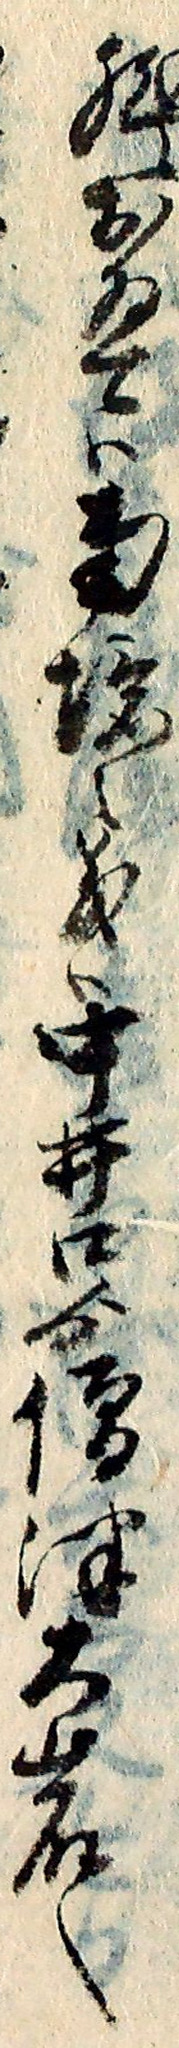然におゐては南境之義は中井口ゟ僧津大岩へ
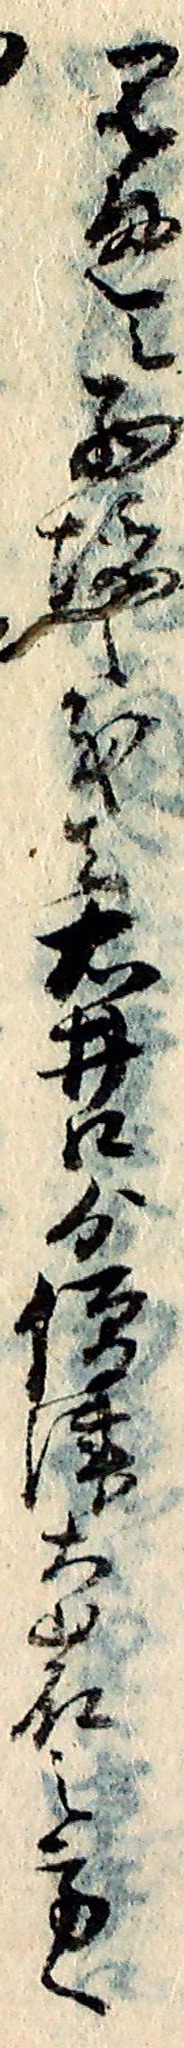見通し西境之義は右井口ゟ僧津大岩之方へ
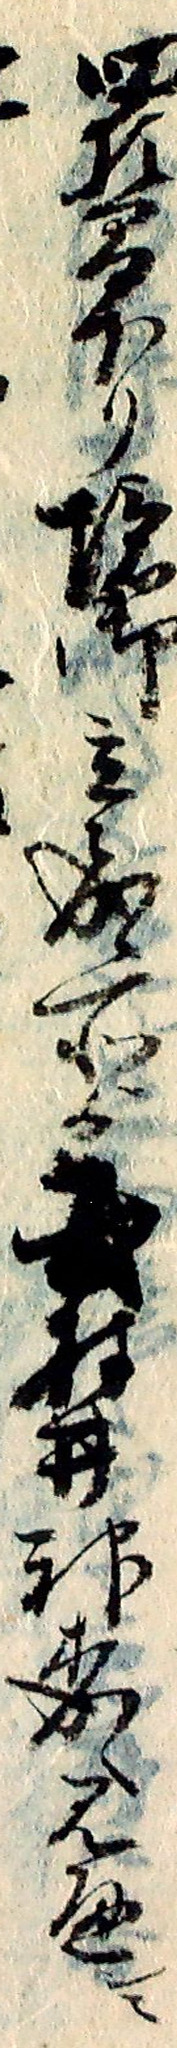四拾間下り境御立被成候所ゟ当村井神森へ見通しに
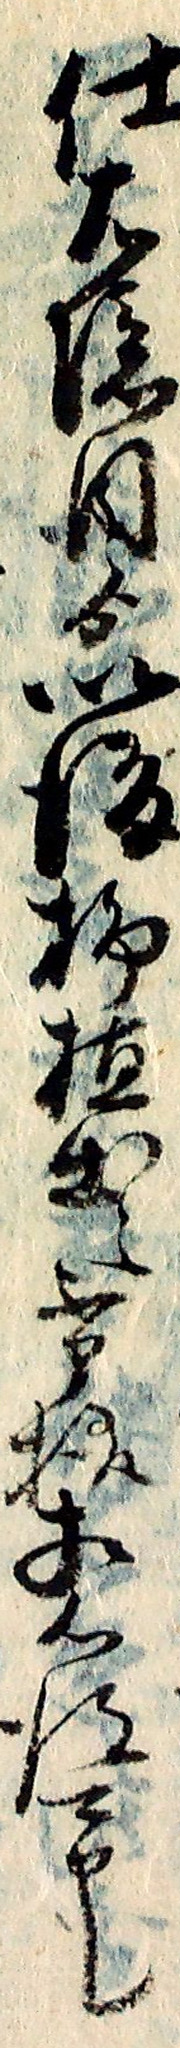仕右境目ゟ以後柳植出し不申様相心得可申候
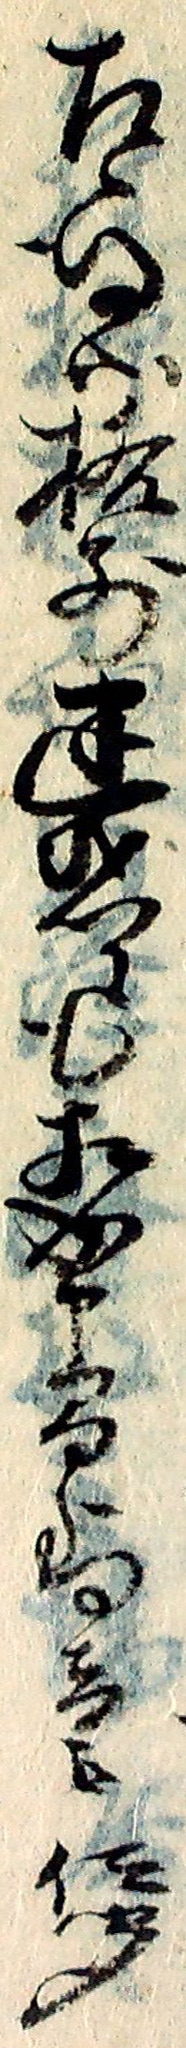左候得は格別迷惑にも相成申間布旨被仰聞
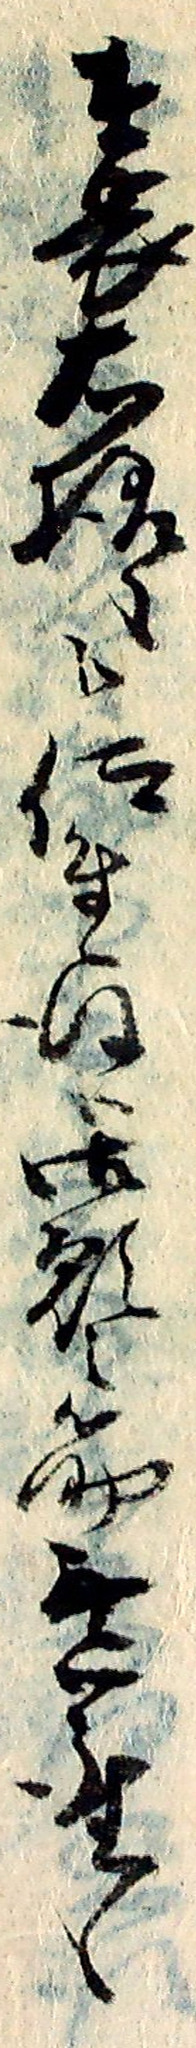奉畏右様に被仰付候得は御願之筋無御座候
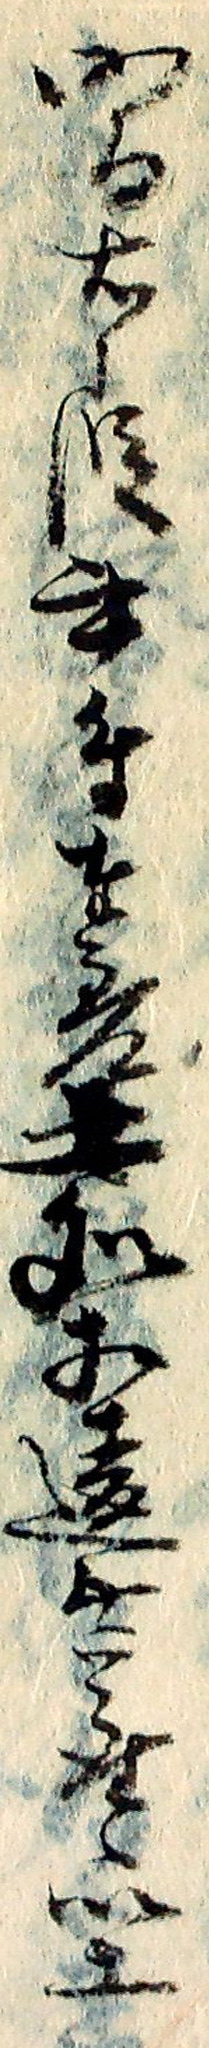仍て右之段書付奉差上処相違無御座候以上
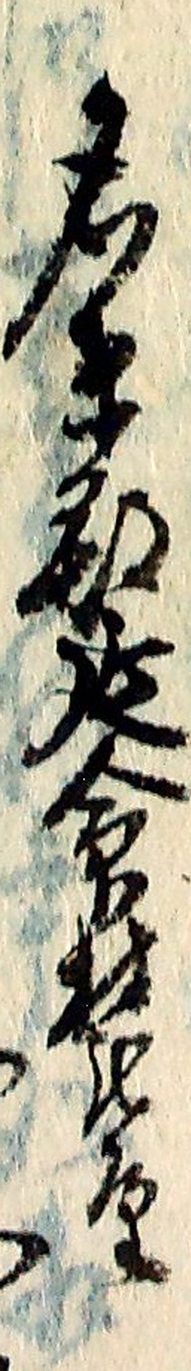名東郡延命村庄屋
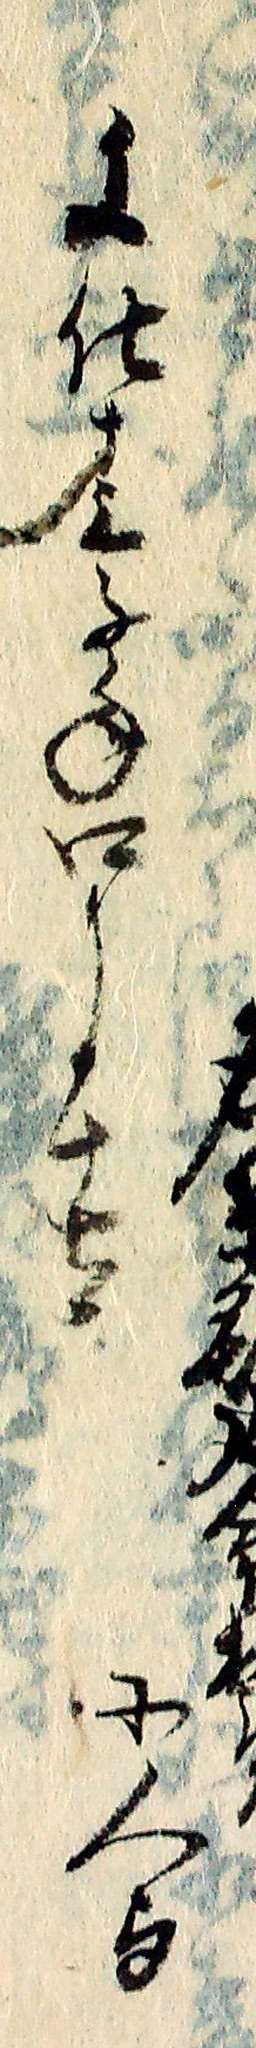文化十三子年四月十七日五人与
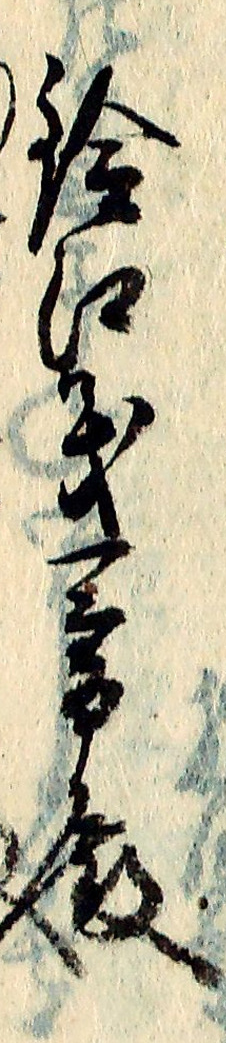鈴江義一郎殿
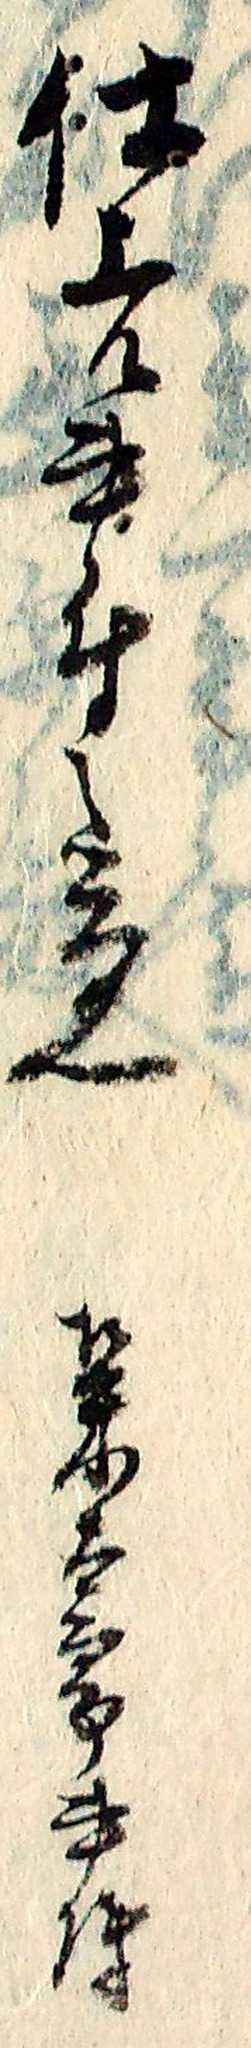仕上る書付之覚栄太郎書付
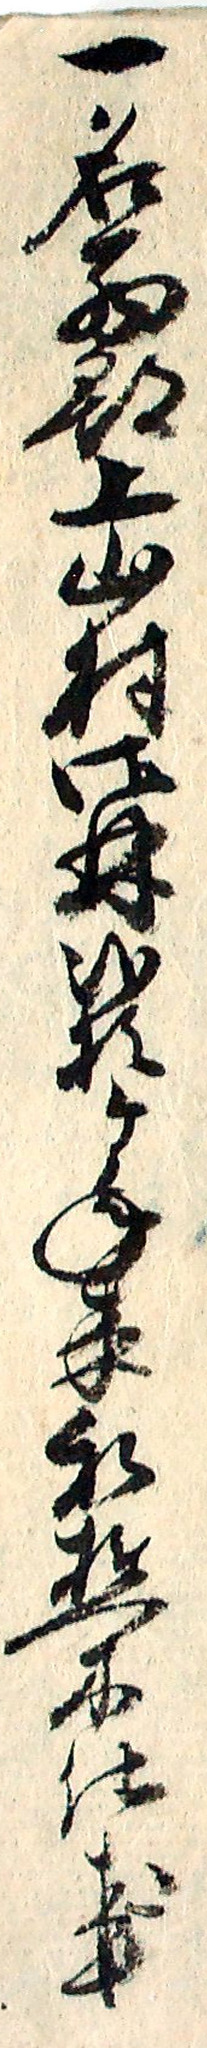一名西郡上山村御林弐拾ヶ年来私樵木仕成
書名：諸御願書控(後藤氏壱番）
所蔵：鳴門教育大学 Naruto University of Education
